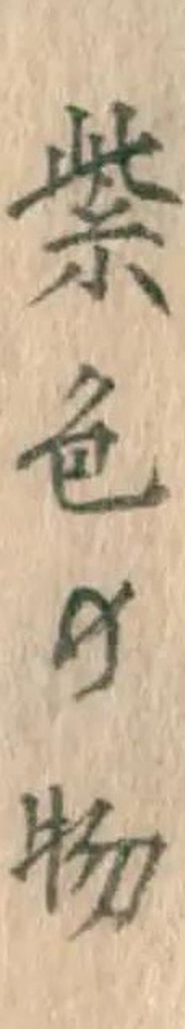紫色の物
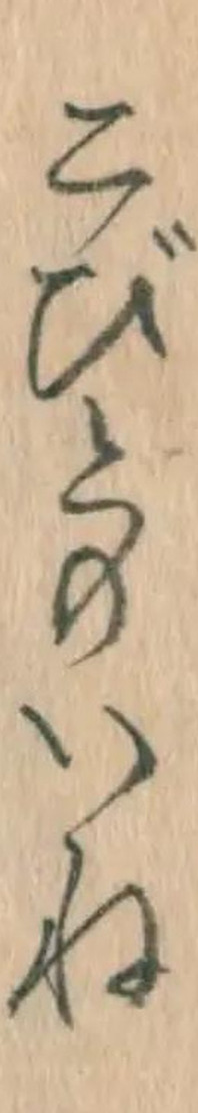こびとのいね
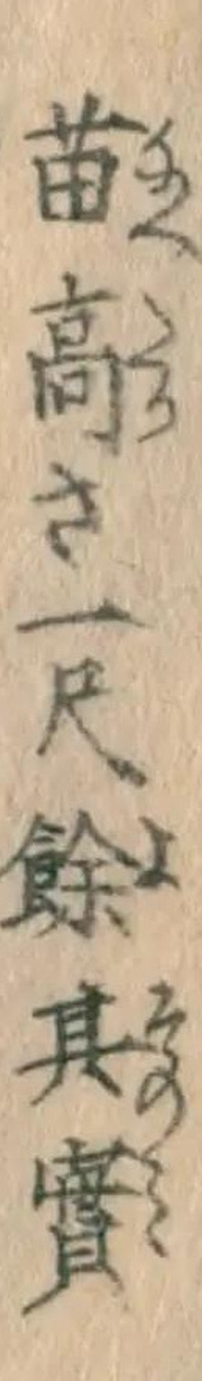苗高さ一尺余其実
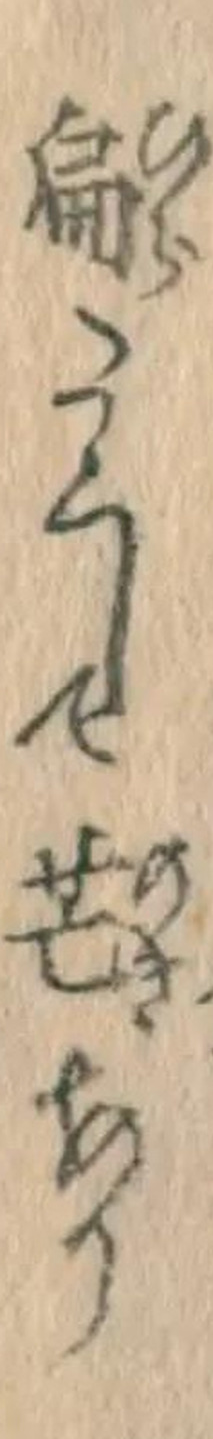扁たくして芒あり
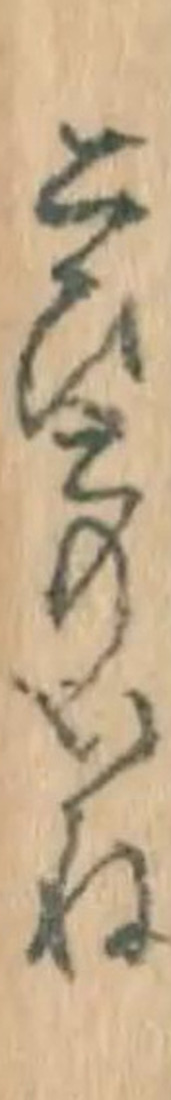こひとのいね

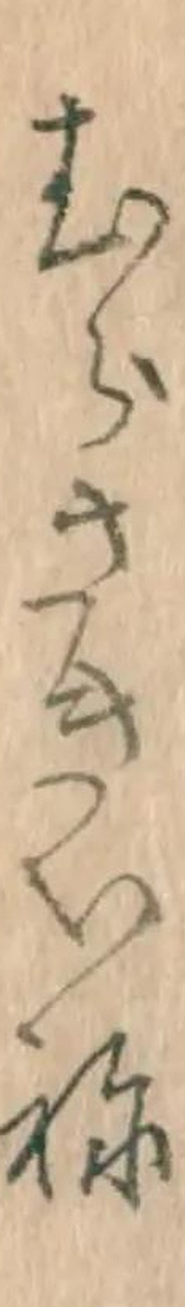むらさきいね
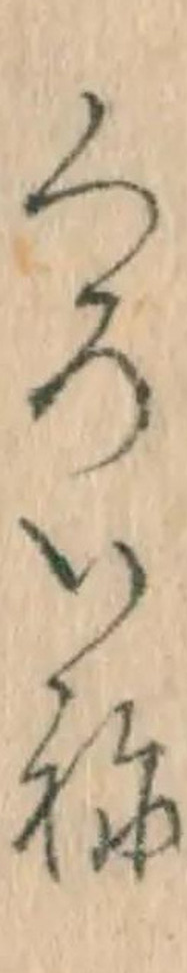くろいね
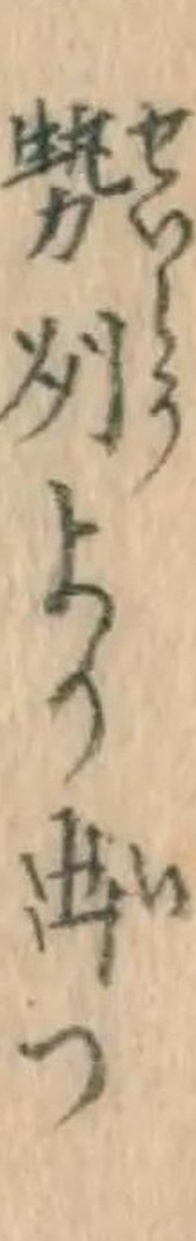勢州より出つ
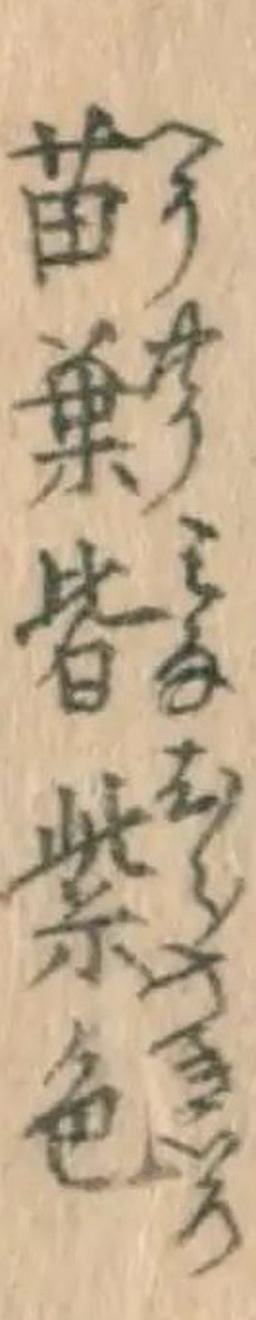苗葉皆紫色
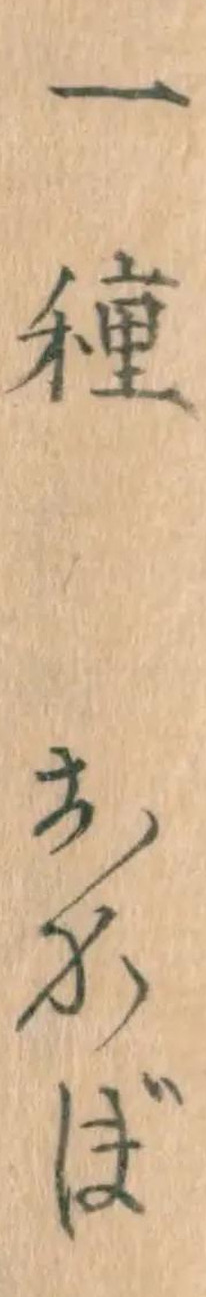一種おかぼ
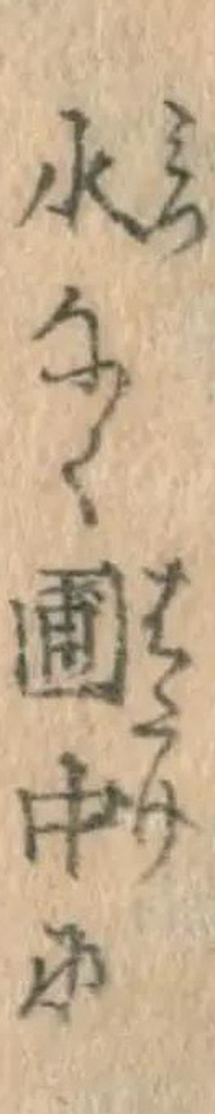水なく圃中に
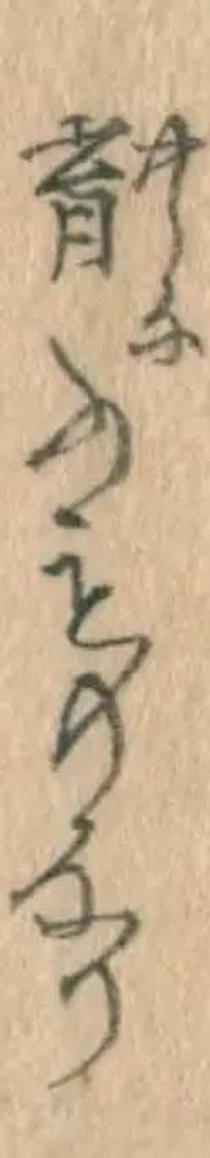育ふものなり

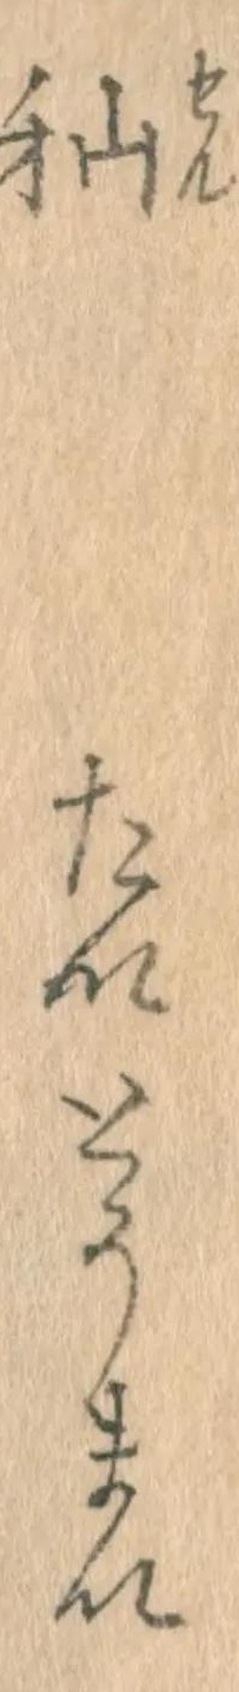秈たいとうまい
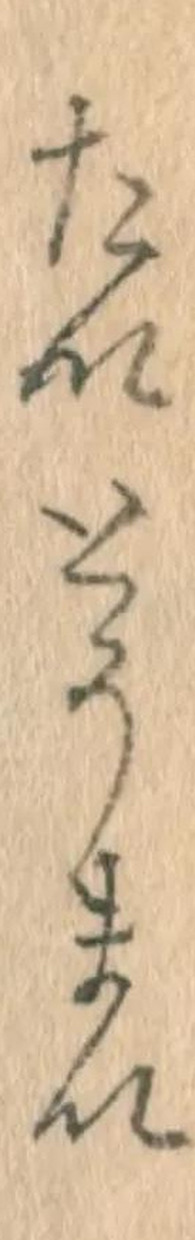秈たいとうまい
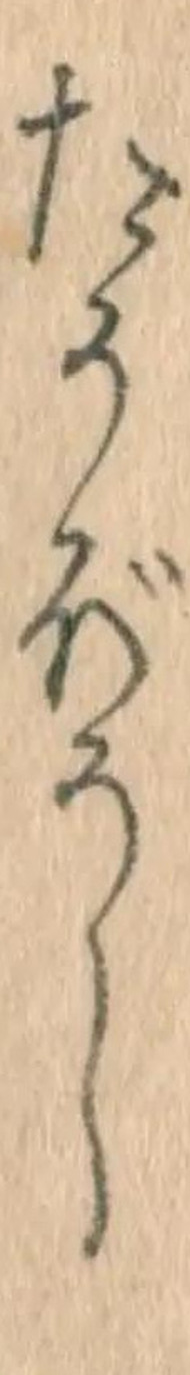たうぼうし
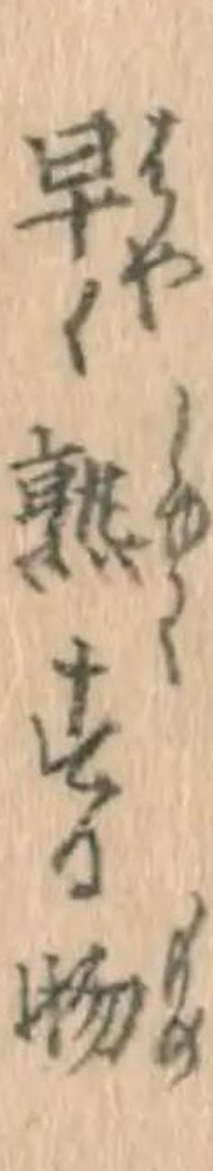早く熟する物
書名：本草図譜. 巻40-42
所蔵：国立国会図書館 National Diet Library, JAPAN
